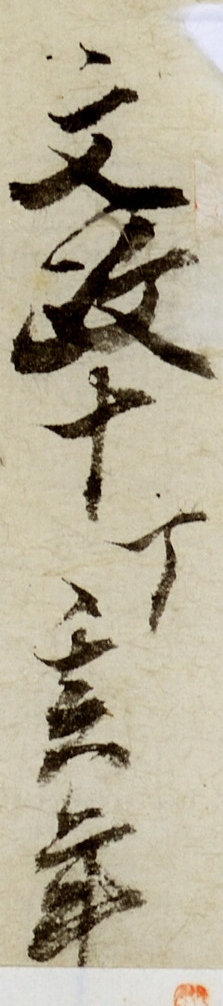文政十丁亥年
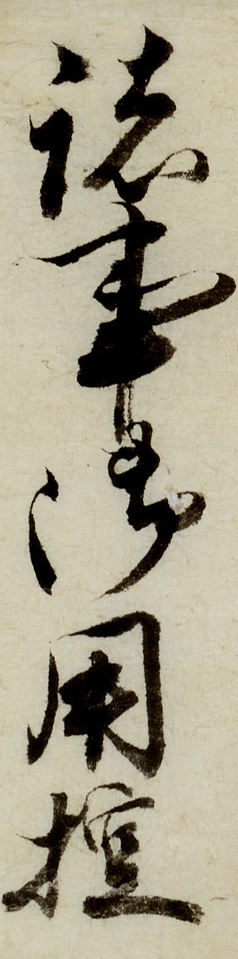諸事御用控
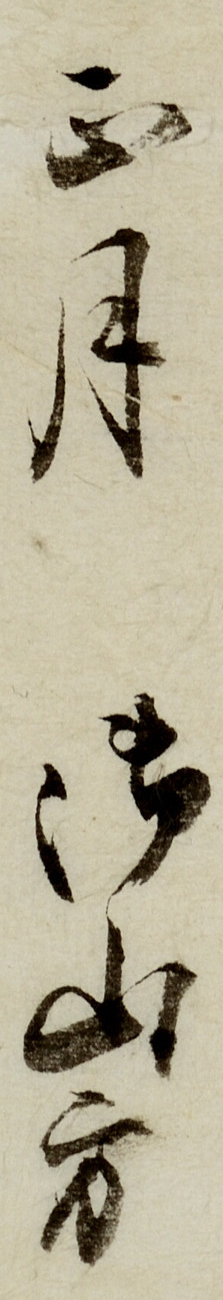正月御山方
